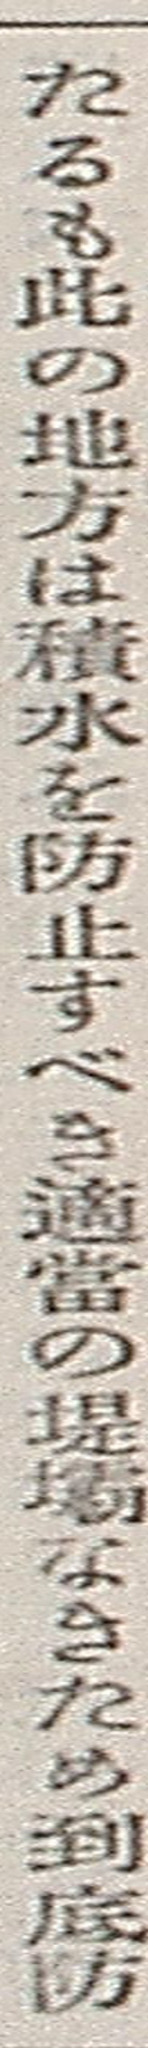たるも此の地方は積水を防止すべき適当の堤壩なきため到底防
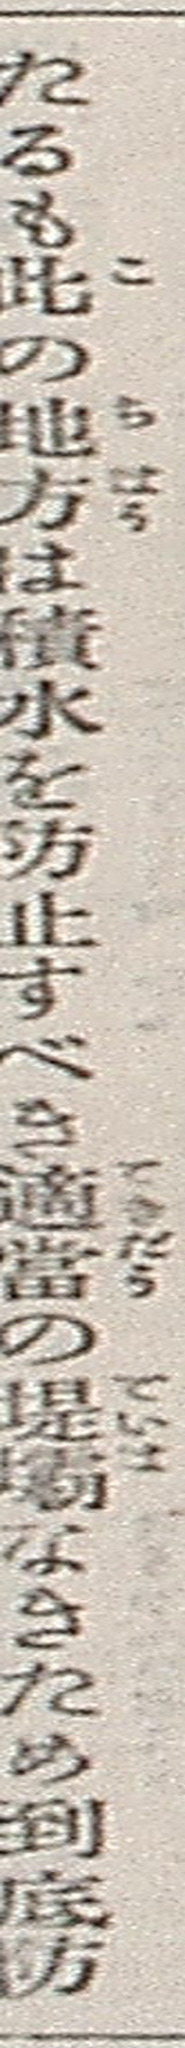たるも此の地方は積水を防止すべき適当の堤壩なきため到底防
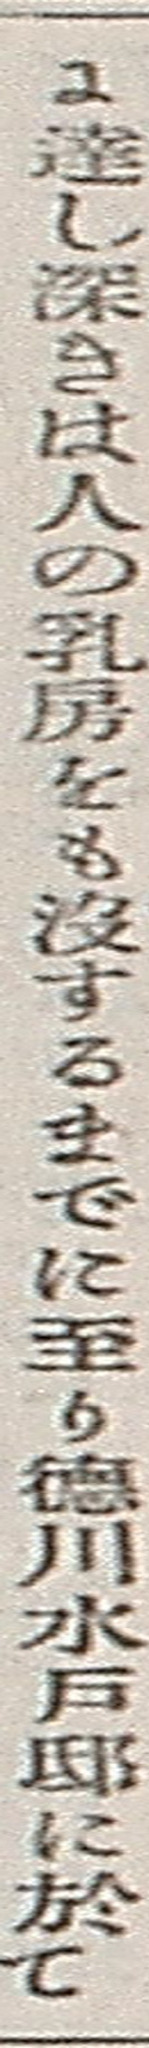に達し深きは人の乳房をも没するまでに至り徳川水戸邸に於て
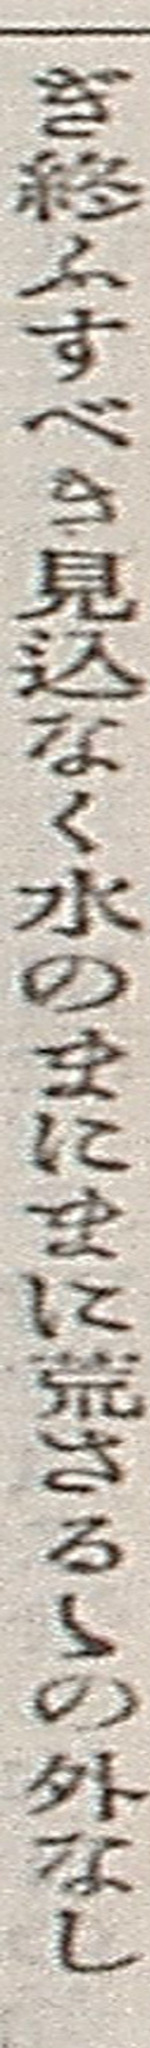ぎ終ふすべき見込なく水のまにまに荒さるゝの外なし
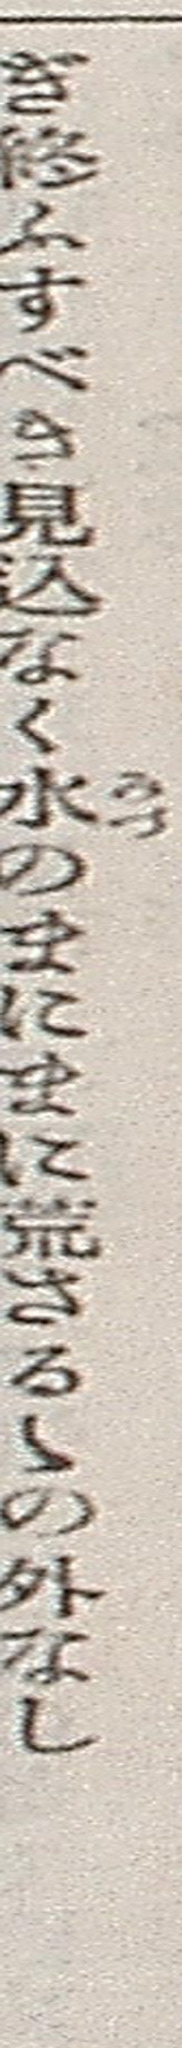ぎ終ふすべき見込なく水のまにまに荒さるゝの外なし

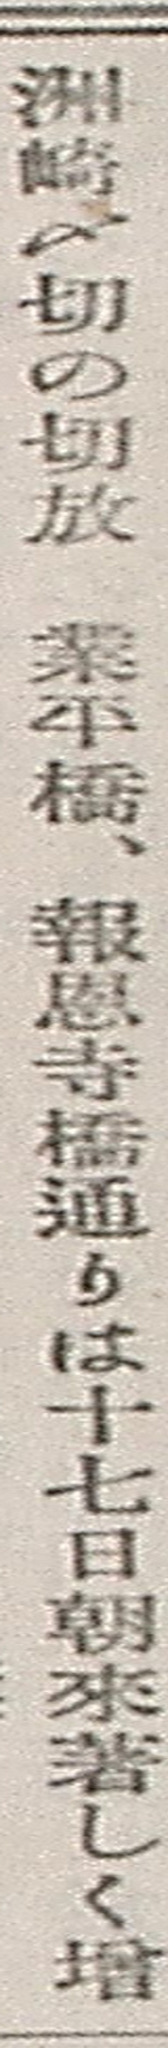洲崎〆切の切放業平橋、報恩寺橋通りは十七日朝来著しく増
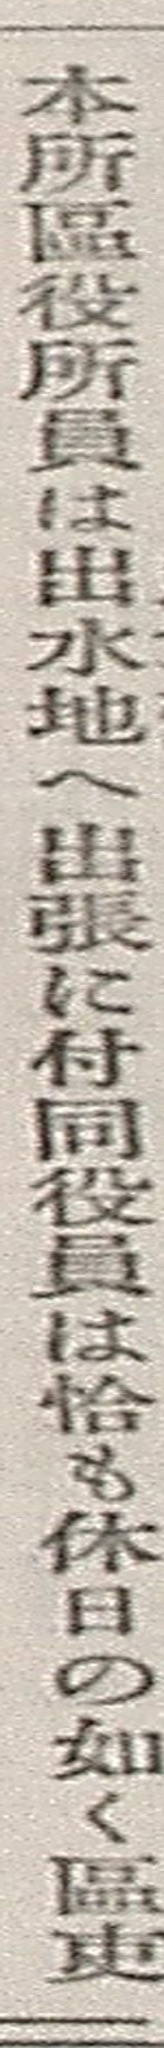本所区役所員は出水地へ出張に付同役員は恰も休日の如く区吏
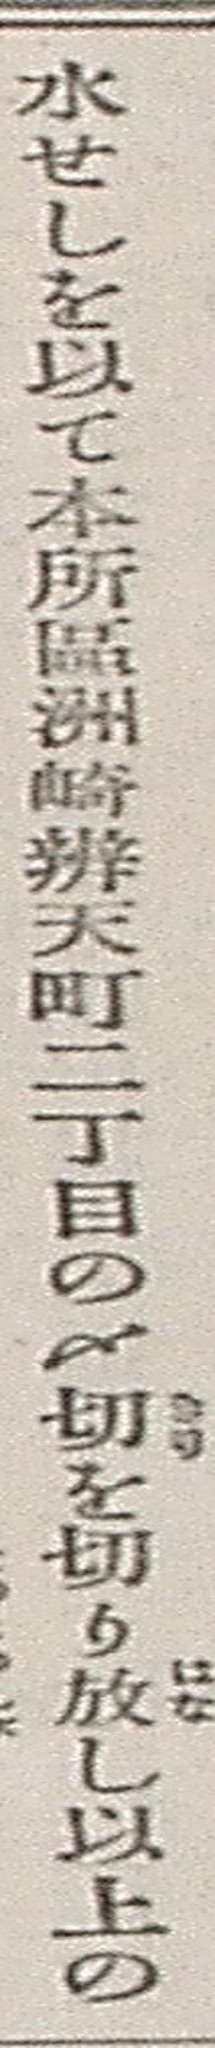水せしを以て本所区洲崎弁天町二丁目の〆切を切り放し以上の
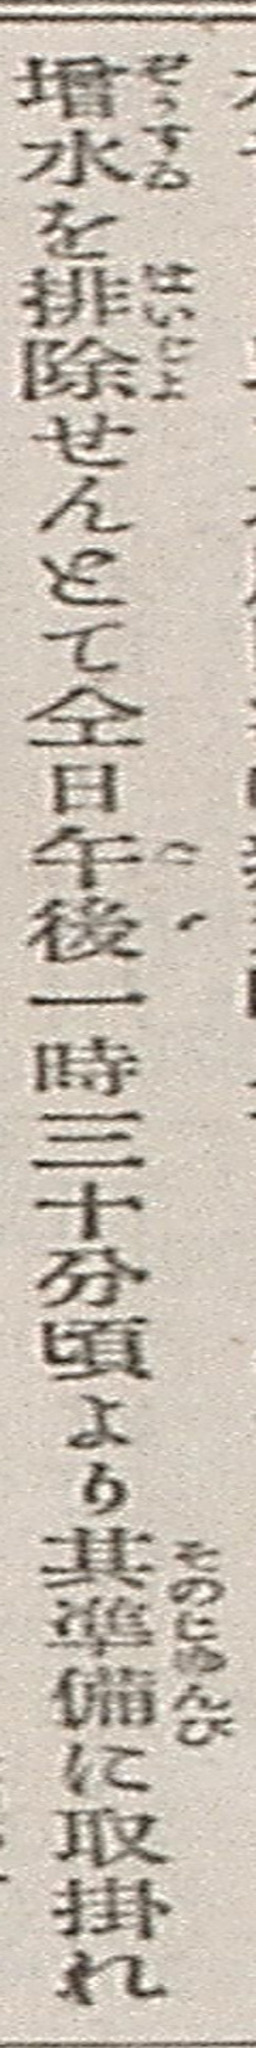増水を排除せんとて仝日午後一時三十分頃より其準備に取掛れ
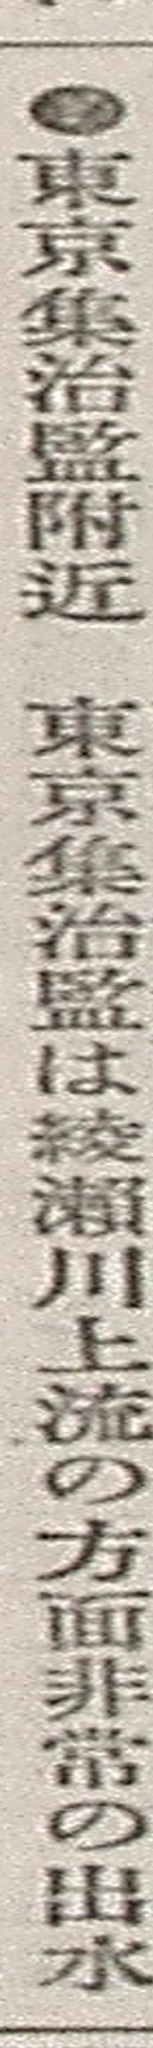●東京集治監附近東京集治監は綾瀬川上流の方面非常の出水
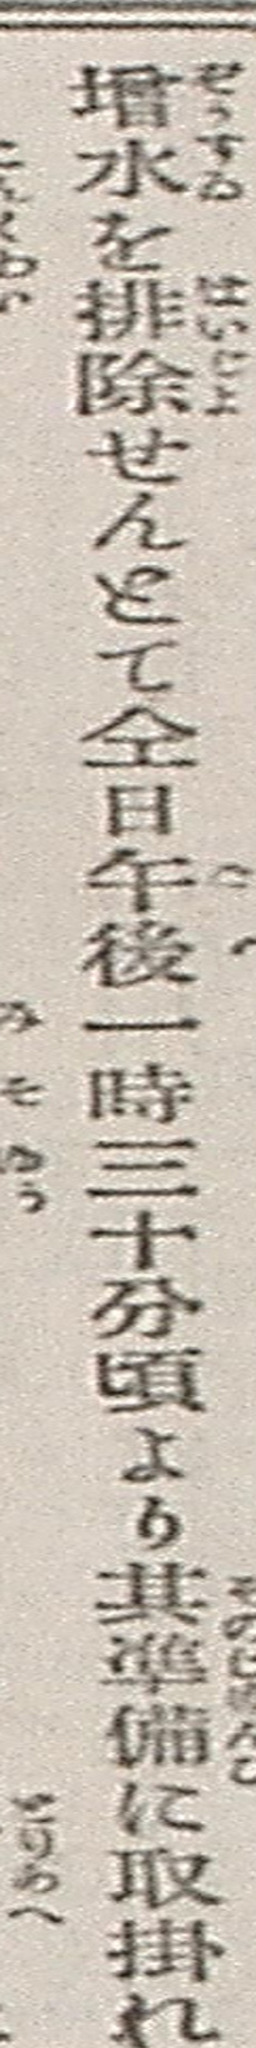増水を排除せんとて仝日午後一時三十分頃より其準備に取掛れ
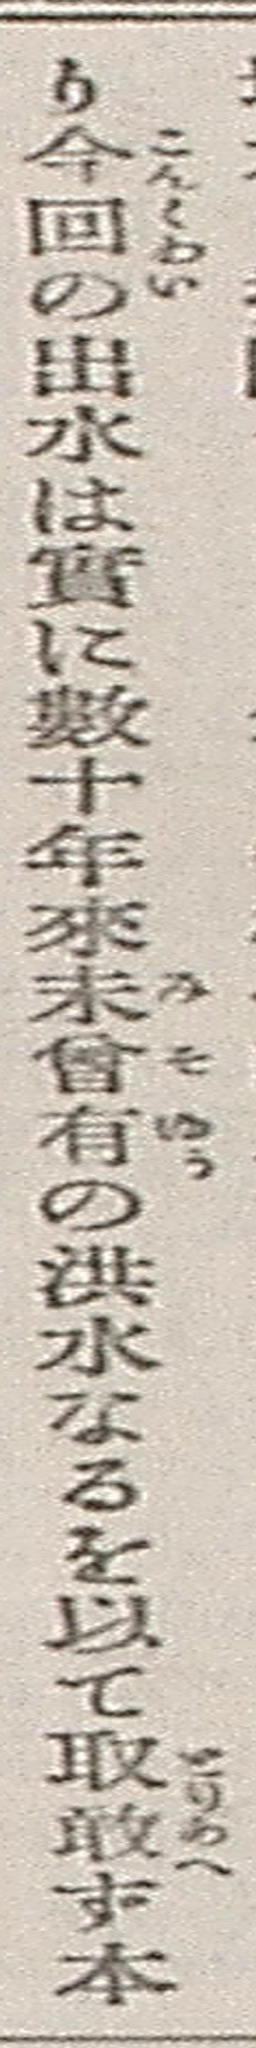り今回の出水は実に数十年来未曾有の洪水なるを以て取敢ず本
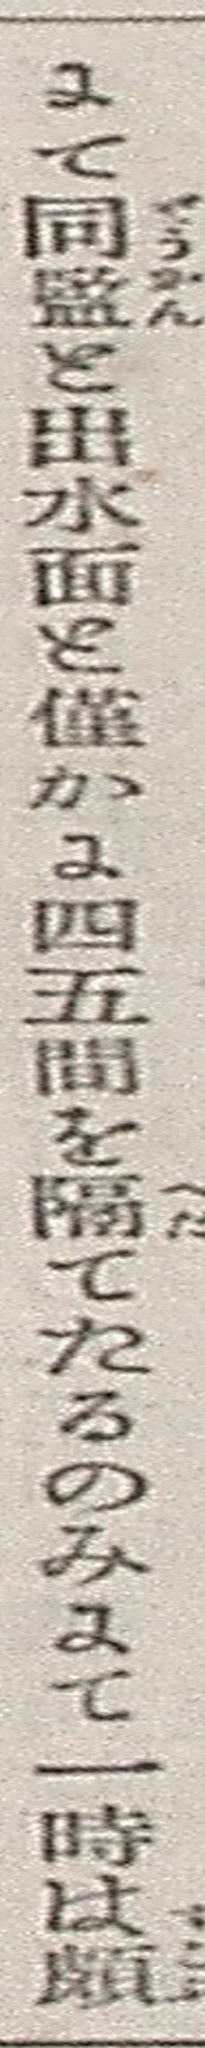にて同監と出水面と僅かに四五間を隔てたるのみにて一時は頗
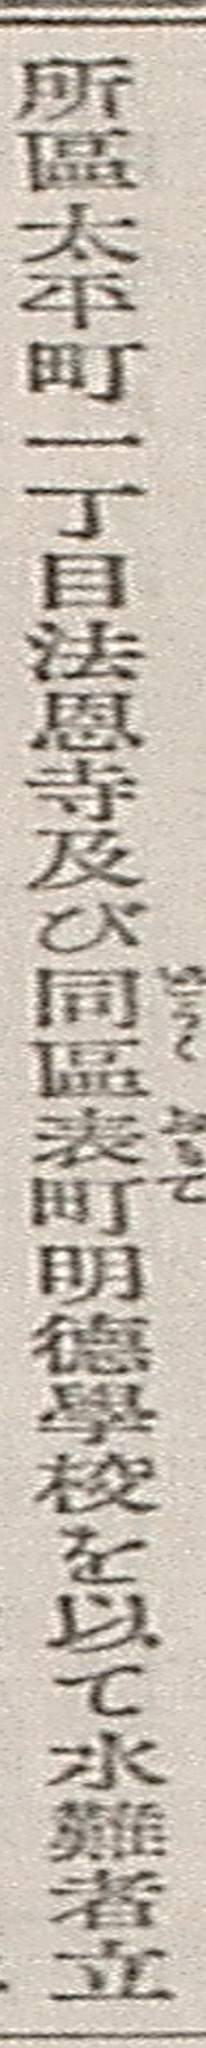所区太平町一丁目法恩寺及び同区表町明徳学校を以て水難者立
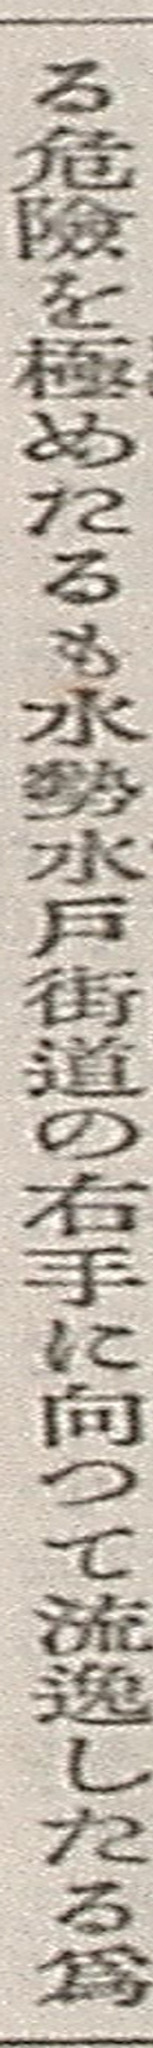る危険を極めたるも水勢水戸街道の右手に向つて流逸したる為
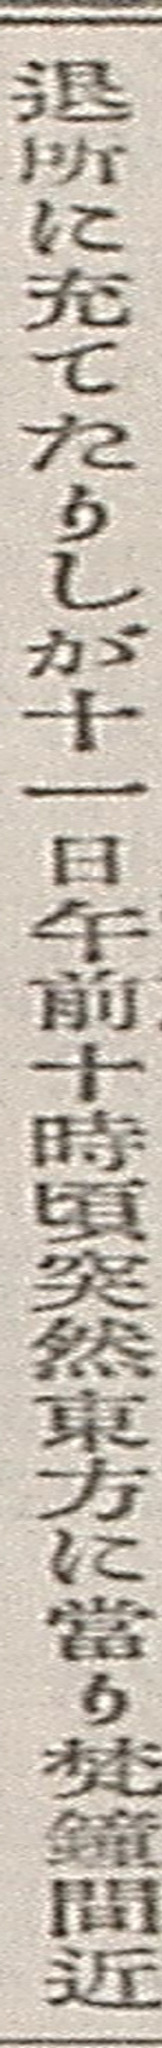退所に充てたりしが十一日午前十時頃突然東方に当り梵鐘間近
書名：風俗畫報臨時増刊第百二十四號　洪水地震被害録（上）
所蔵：東京大学地震研究所図書室 Earthquake Research Institute Library, The University of Tokyo, JAPAN
